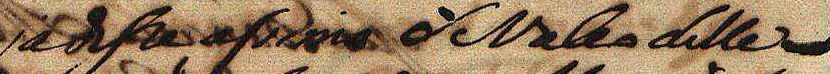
ja disse assima Se Valeo delle
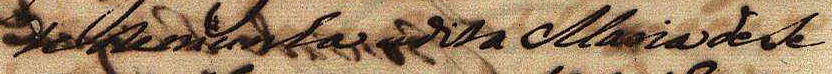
testemunha a dita Maria de Ie
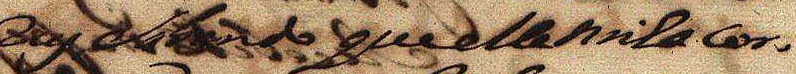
zus Sabendo que elle tinha cor
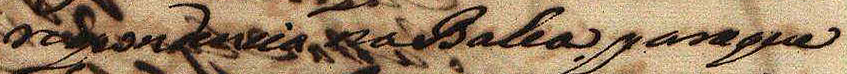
respondencia na Bahia, para que
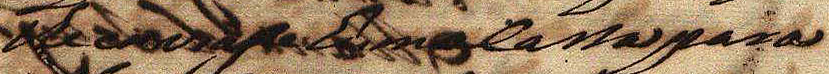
lhe enviasse huma Carta para
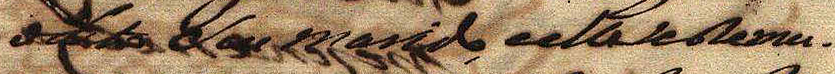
o dito Seu marido, e elle testemu
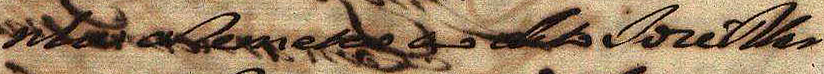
nha a Remeteo ao dito Ioze Mar
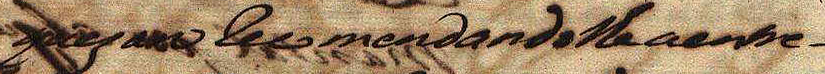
quezam Recomendandolhe a entre
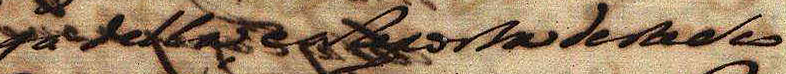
ga della e a Reposta deste seo
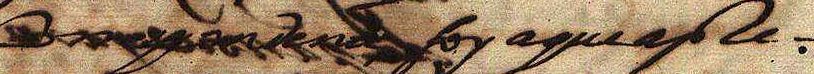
Correspondente foy a que apre
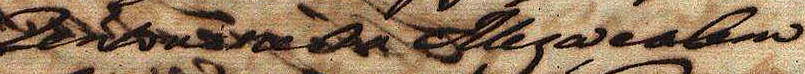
zentou nesta Meza, e alem
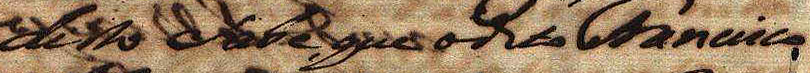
disto Sabe, que o dito Francisco
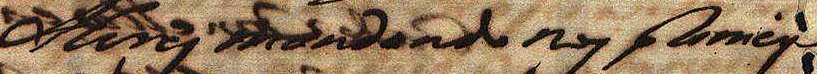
Alvres mandando nos primey
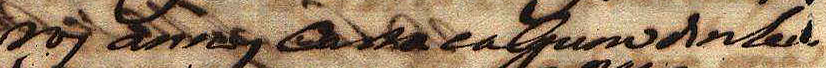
ros annos carta e algum dinhei
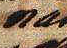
nas
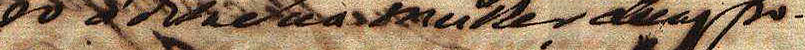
ro a dita sua mulher duas fro
